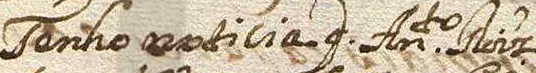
Tenho noticia q̄. An.to Roiz̄
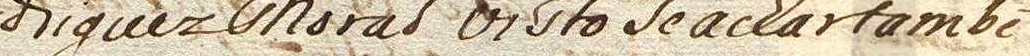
driguez Moraõ visto se achar tambē
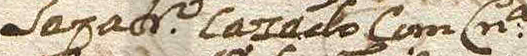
sapatr.o cazado com Cn:a
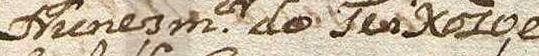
Nunes, m.er do Teixozo, e
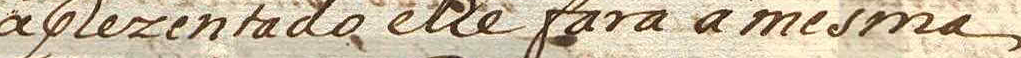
apRezentao e lhe fará a mesma
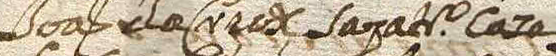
Ioaõ da Crus, sapatr.o caza
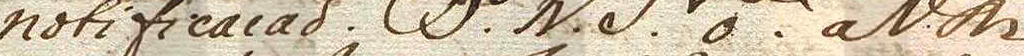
notificaçaõ. D.s N. S.r g.de a V M
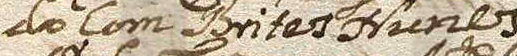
do com Brites Nunes
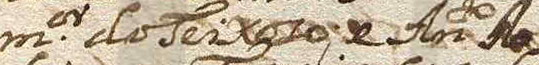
m.er do Teixozo; e Anto Ro
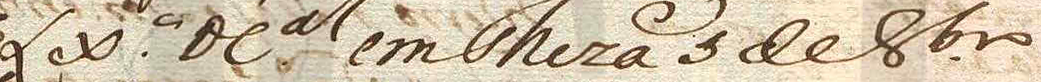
Lx.a oc.al em Meza 5 de 8.bro
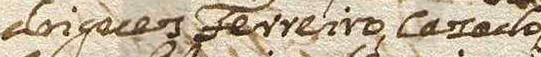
drigues Ferreiro, cazado
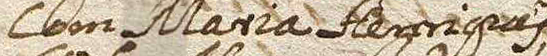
Com Maria Henriques,
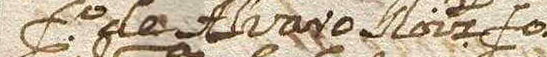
f.o de Alvaro Roiz̄ fo
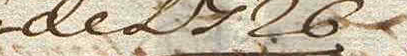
de 1726
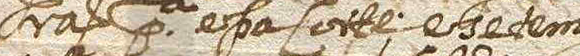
raõ p.a essa Corte; e se tem
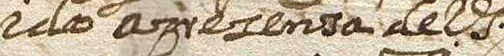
ido a prezensa de V. S.
